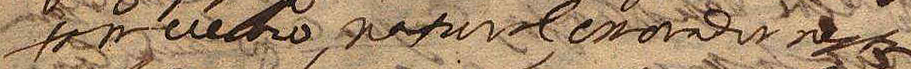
tam uelho, natural, e morador nesta
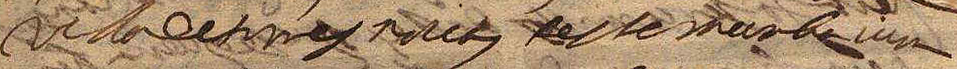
villa de torres nouas testemunha iura
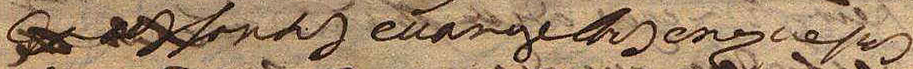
da aos santos euangelhos em que pos
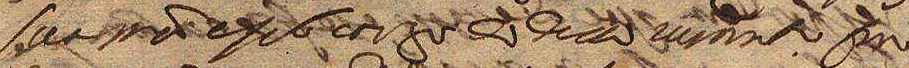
sua maõ e sob cargo do ditto iuramt.o pro
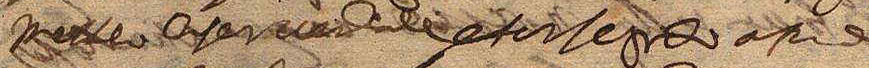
metteo dizer uerdade, e ter segredo a tudo
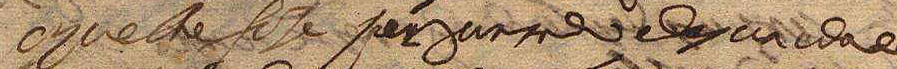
o que lhe fose perguntado, e de sua idade
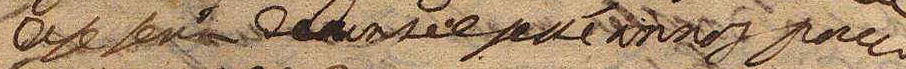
dise seria de uinte e sette annos pouco
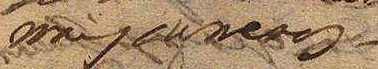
mais ou menos
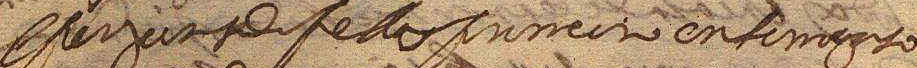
E perguntado pello primeiro enterrogato
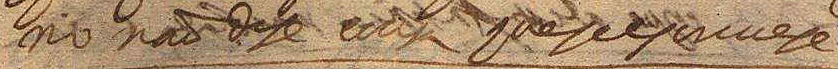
rio não dise cousa que se escreuese
